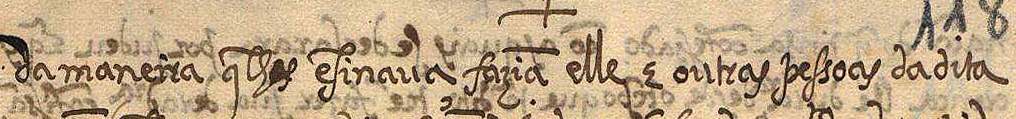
da maneira q̄ lhes ēsinaua faziā elle E outras pessoas da dita
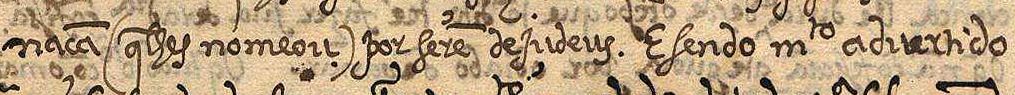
naçā (q̄ lhes nomeou) por serē de judeus. E sendo mto aduertido
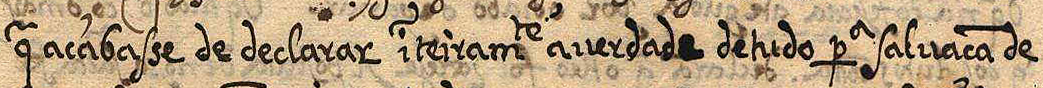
q̄ acabasse de declarar īteiramtē a uerdade de tudo ꝑa saluaçā de
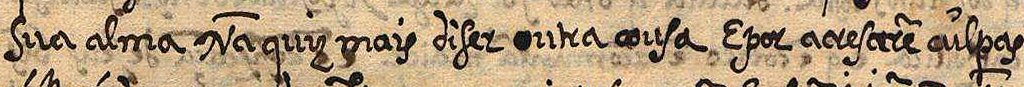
sua alma Nā quiz mais diser outra cousa E por acrescere̅ culpas
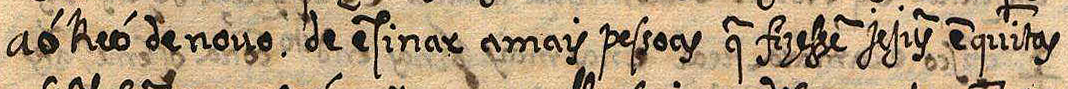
ao Reo de nouo, de ēsinar a mais pessoas q̄ fizessē jejūs ē quītas
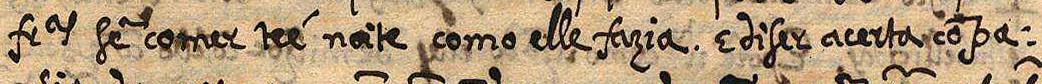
fras sē comer teé noite como elle fazia. E diser a certa cōpa:
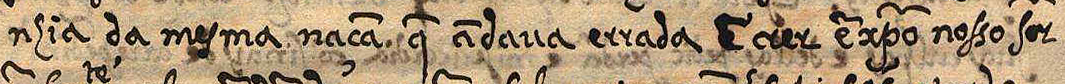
nhia da mesma naçā q̄ ādaua errada ē crer ē xpō nosso sor̄
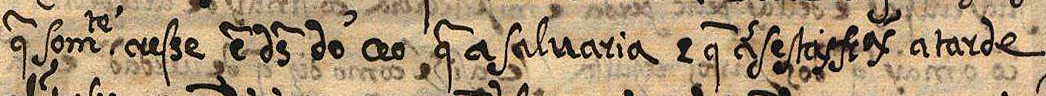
q̄ somte cresse ē ds̄ do ceo q̄ a saluaria E q̄ as sestas fras a tarde
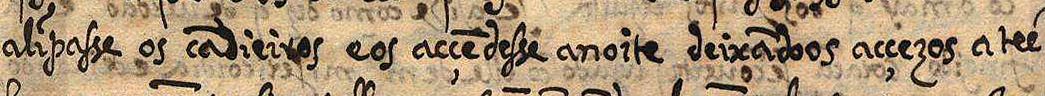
alīpasse os cādieiros e os acçēdesse a noite deixādoos acçezos ateé
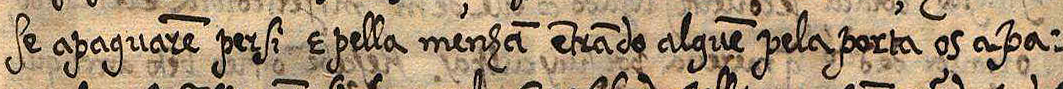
se apaguarē per si E pella menhā ētrādo alguē pela porta os apa
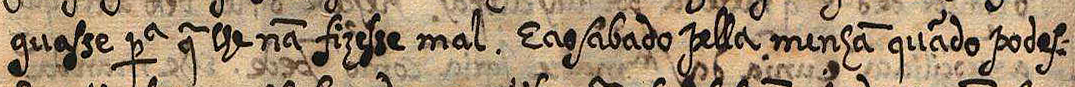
guasse ꝑa q̄ lhe nā fizesse mal. E ao sabado pella menhã quādo podes
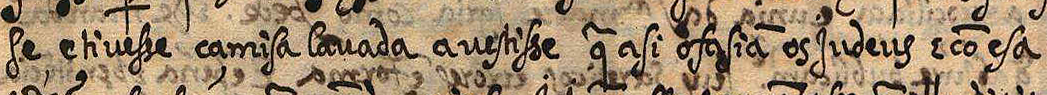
se e tiuesse camisa lauada a uestisse q̄ asi o fasiā os Judeus e cō esa
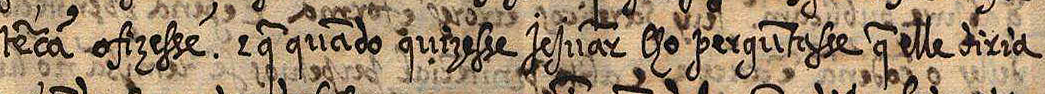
tēça o fizessē. E q̄ quādo quisesse jejuar lho pergūtasse q̄ elle diria
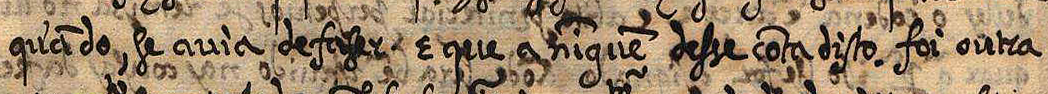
quādo, se auia de fazer. E que ninguē desse cōta disto foi outra
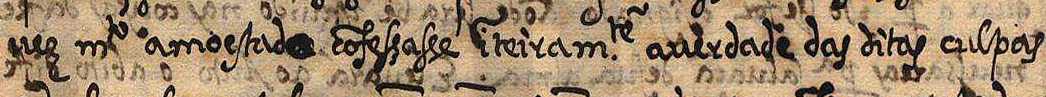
uez mto amoestado cōfessasse iteiram.tē a uerdade das ditas culpas
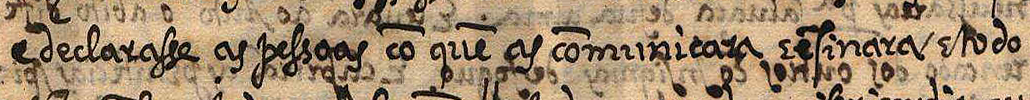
e declarasse as pessoas cō quē as comunicara E ēsinara E todo
